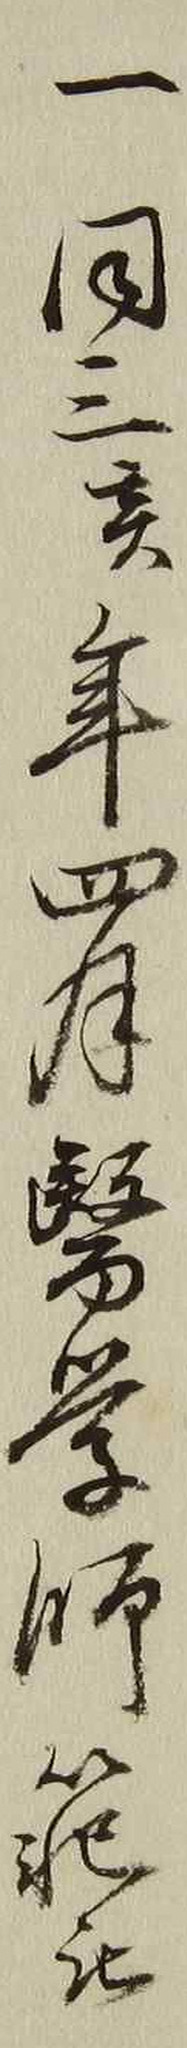一同三亥年四月医学師範被
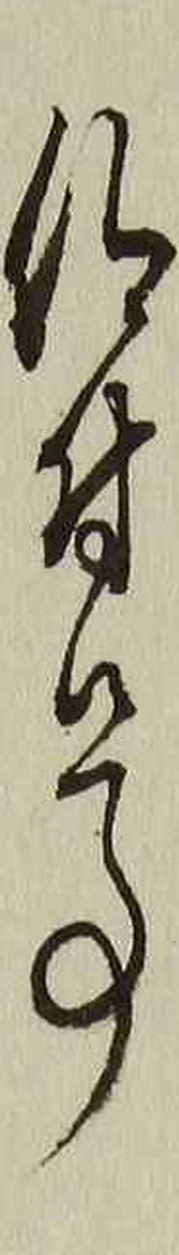仰付候事
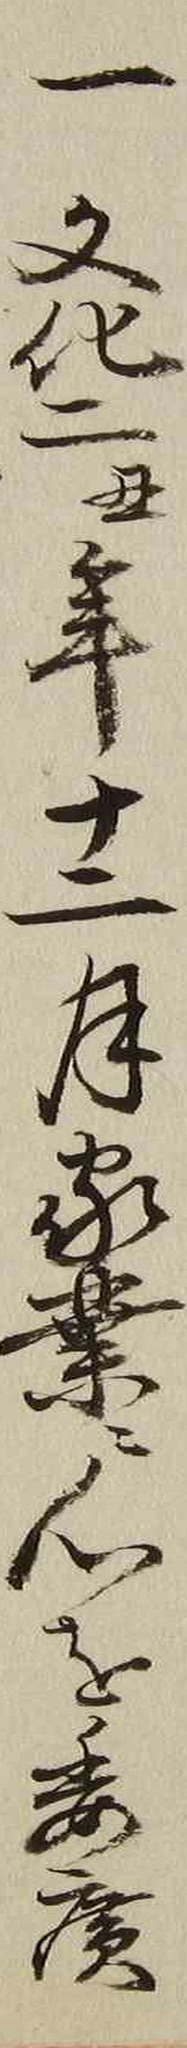一文化二丑年十二月家業ニ心を委広
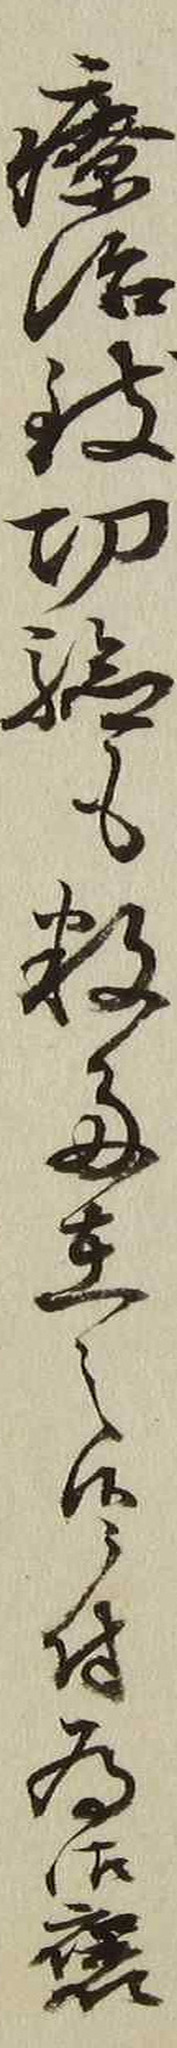療治致功験も数多在之候ニ付為御褒
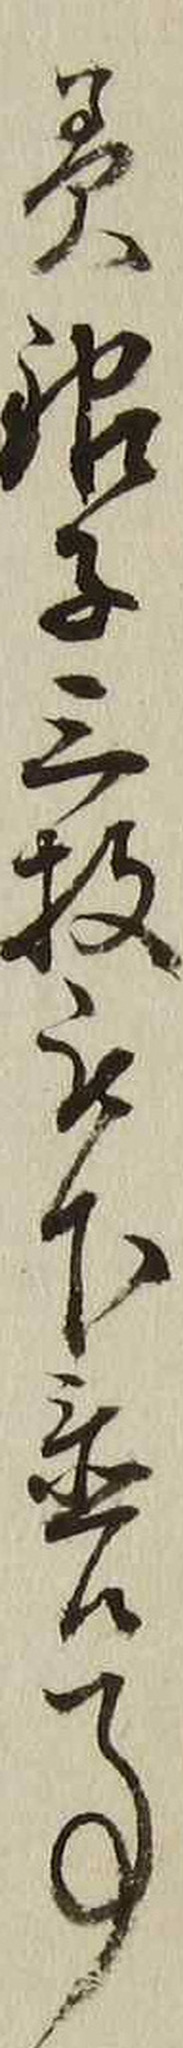美銀子三枚被下置候事
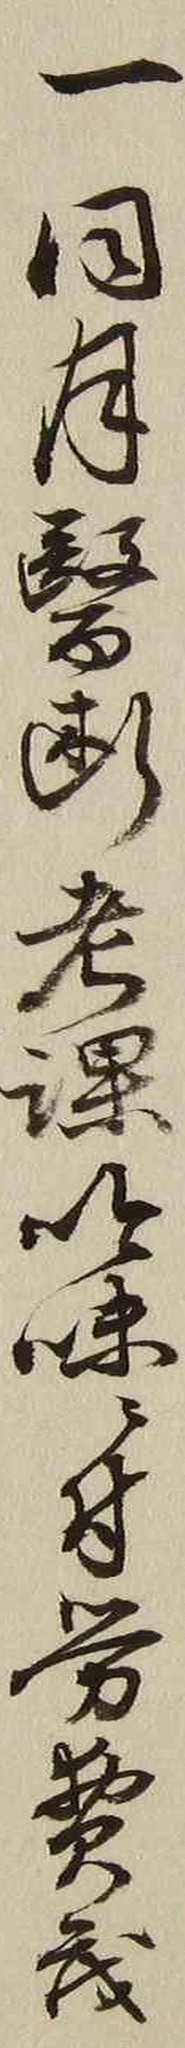一同月医術考課吟味ニ付労費茂
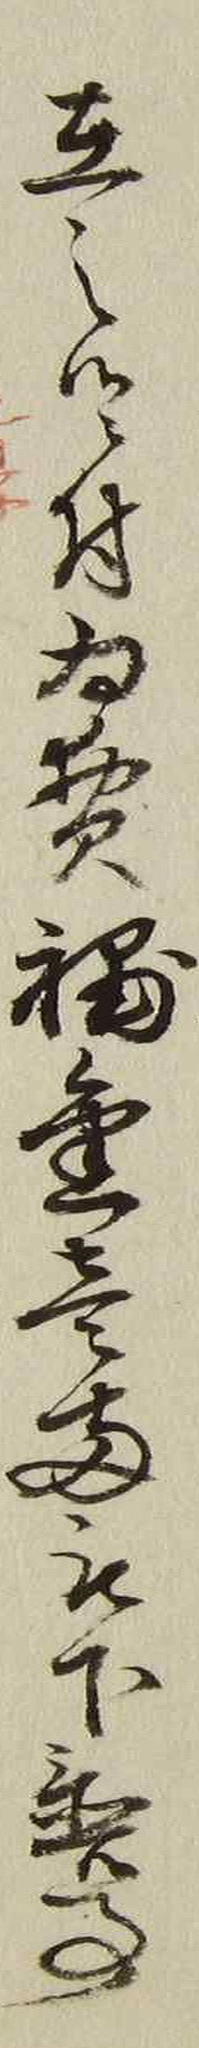在之候ニ付為費補金壱両被下置候事
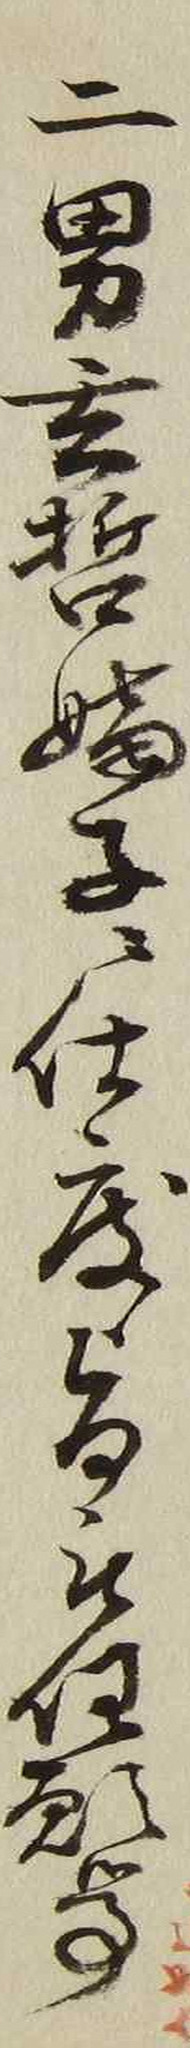二男玄哲嫡子ニ仕度旨被任願候事
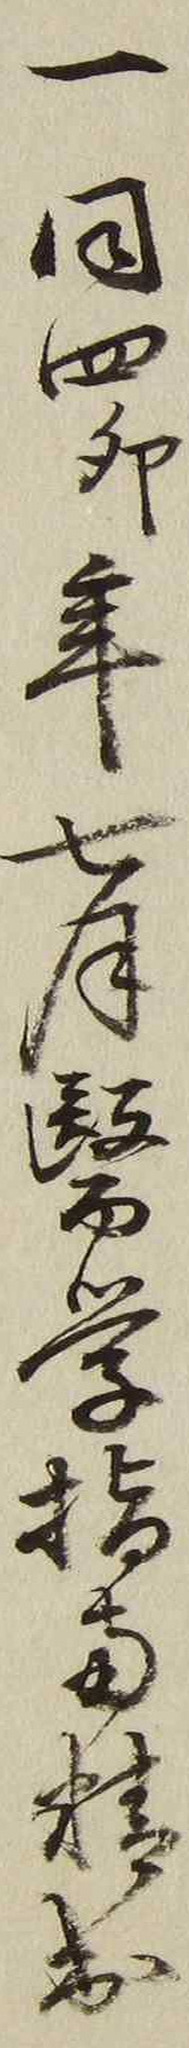一同四卯年七月医学指南精出

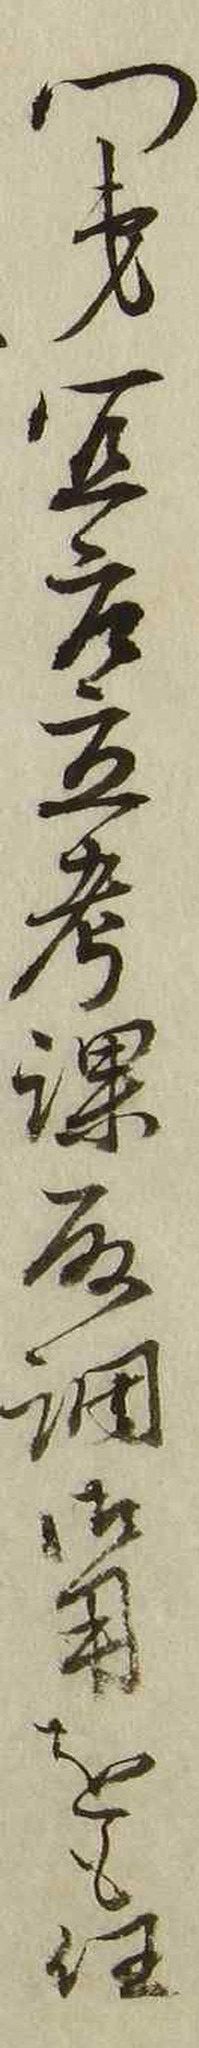門弟宜取立考課取調御用をも任
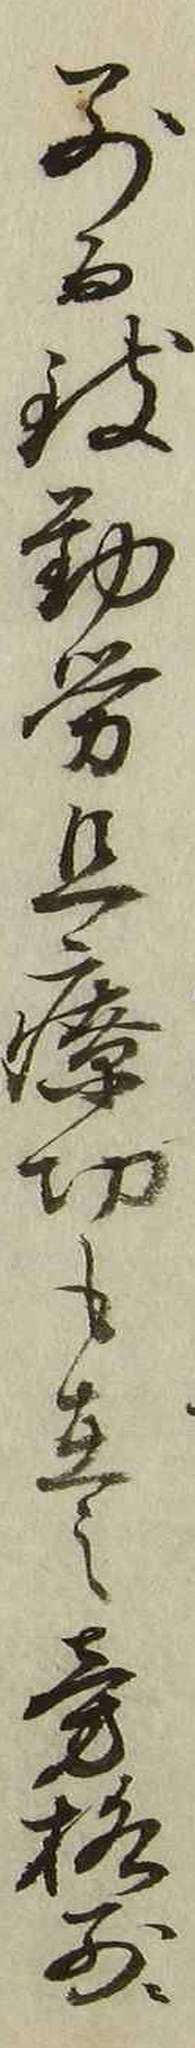別而致勤労且療功も在之旁格別ニ
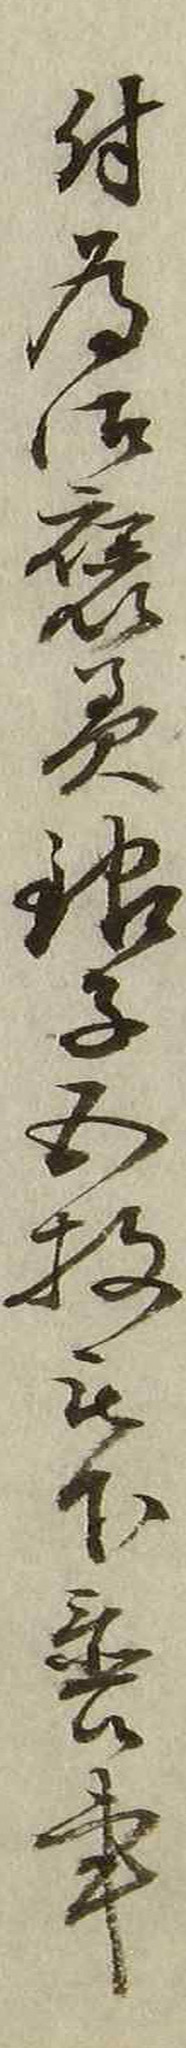付為御褒美銀子五枚被下置候事
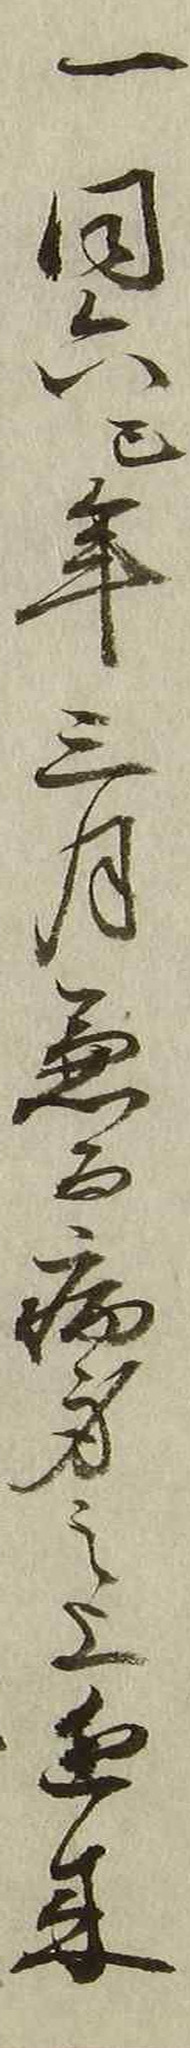一同六巳年三月兼而病身之上近来
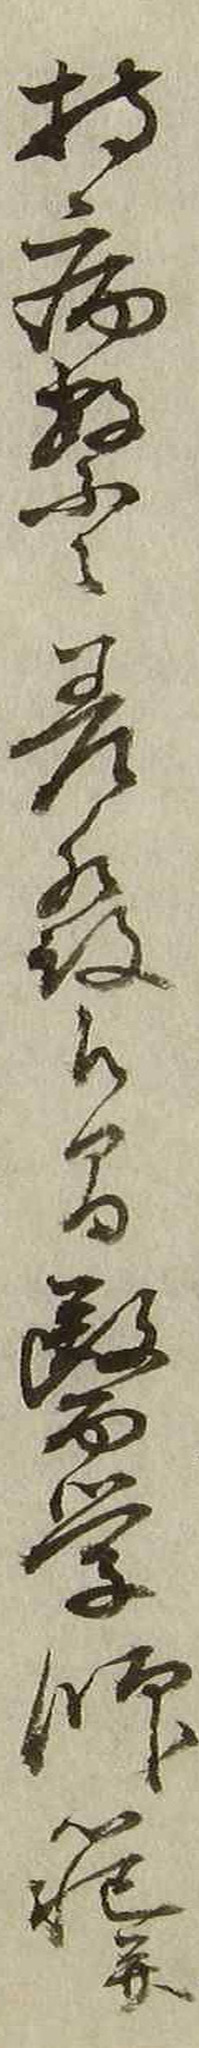持病繁々差発候間医学師範并
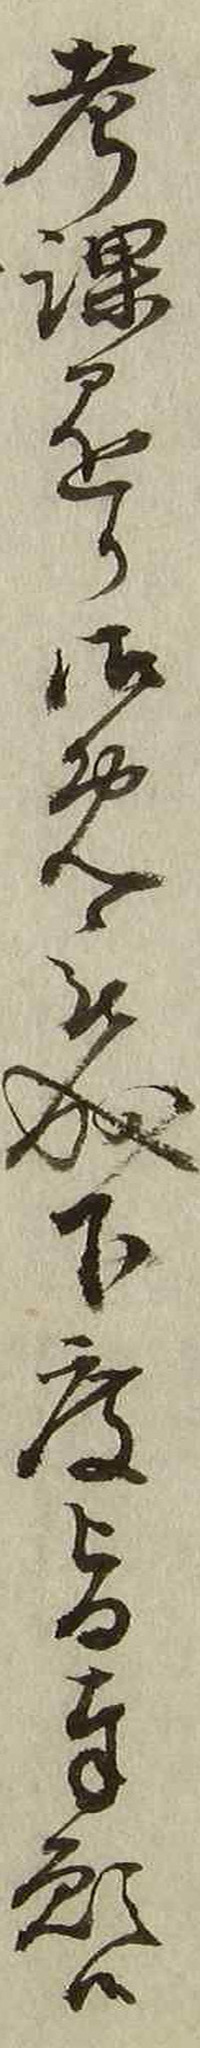考課懸り御免被成下度旨奉願候
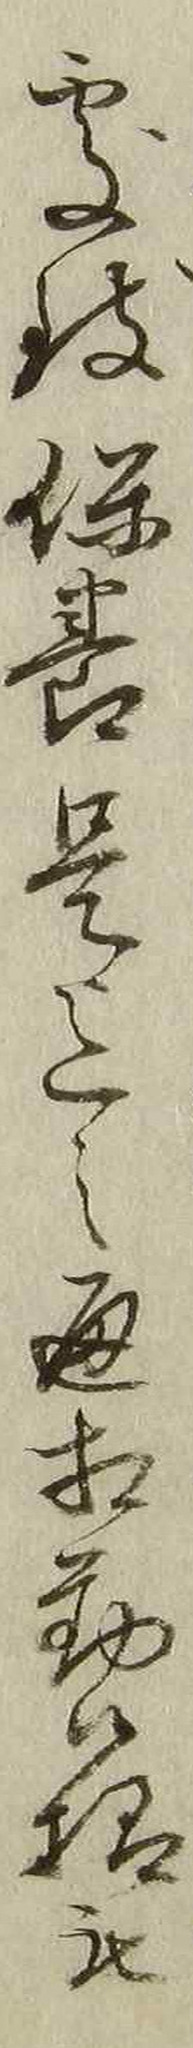処致保養是迄之通相勤候様被
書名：諸士系譜　巻之39　は之部7
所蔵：会津若松市立会津図書館
